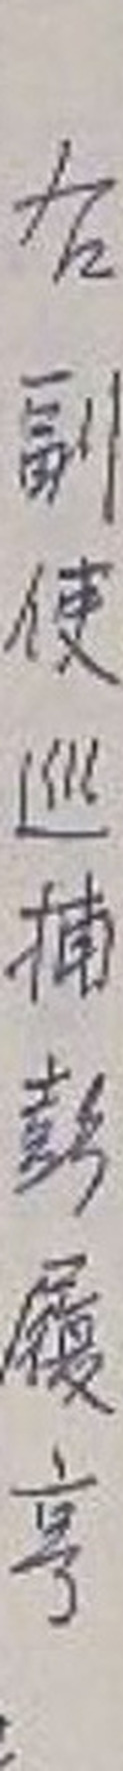右副使巡捕彭履亨
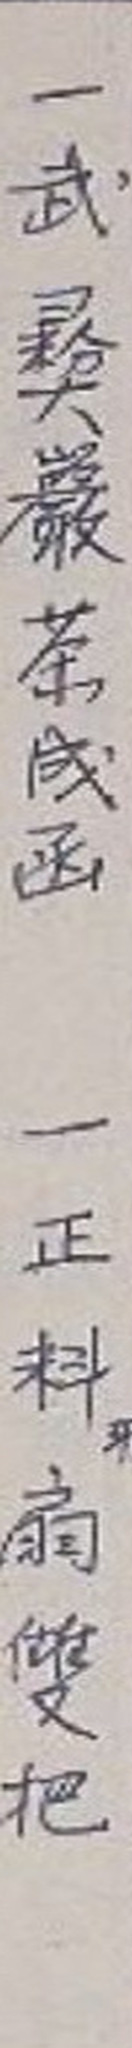一武彛巖茶成函一正料雅扇雙把
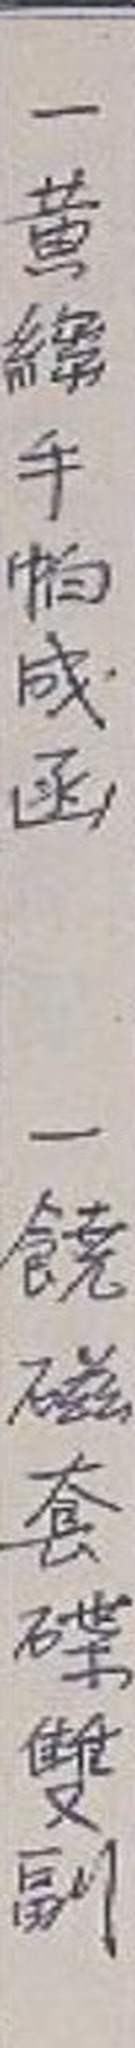一黄縐手帕成函一饒磁套碟雙副
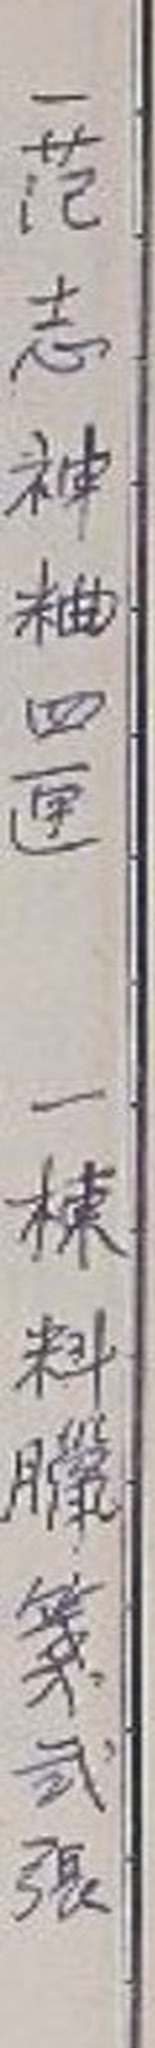一范志神粬四匣一棟料臘箋弐張
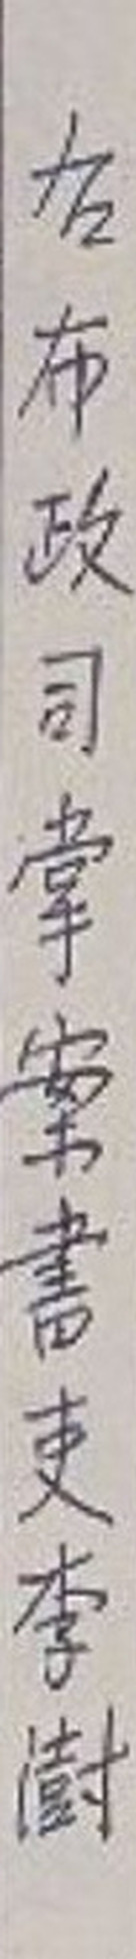右布政司掌案書吏李澍
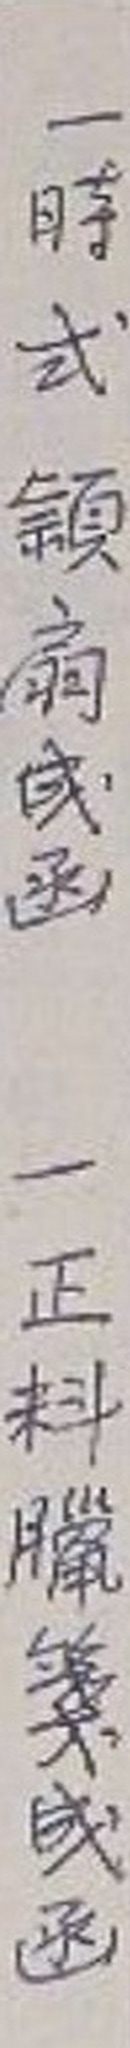一時式頴扇成函一正料臘箋成函
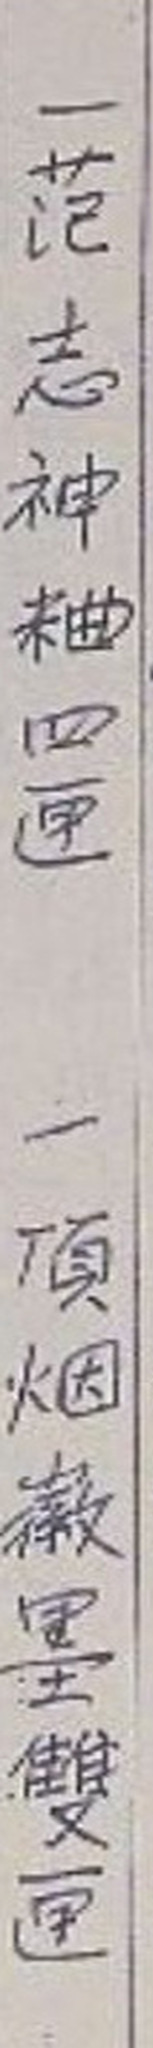一范志神粬四匣一頂烟徽墨雙匣
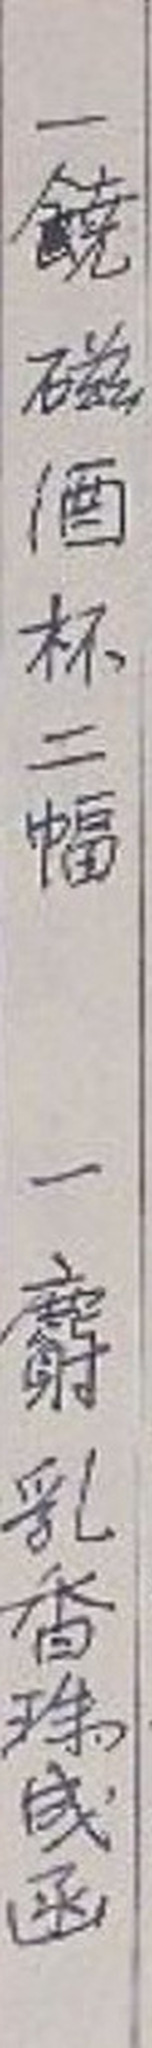一饒磁酒杯二幅一麝乳香珠成函
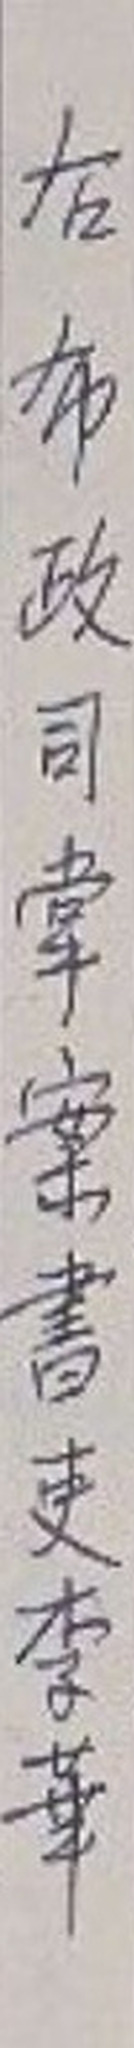右布政司掌案書吏李華
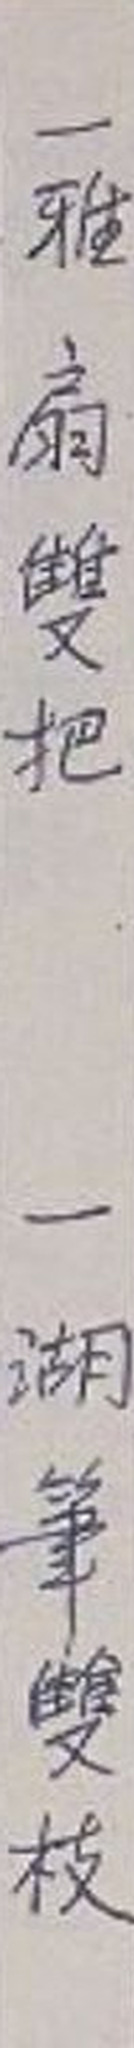一雅扇雙把一湖筆雙枝
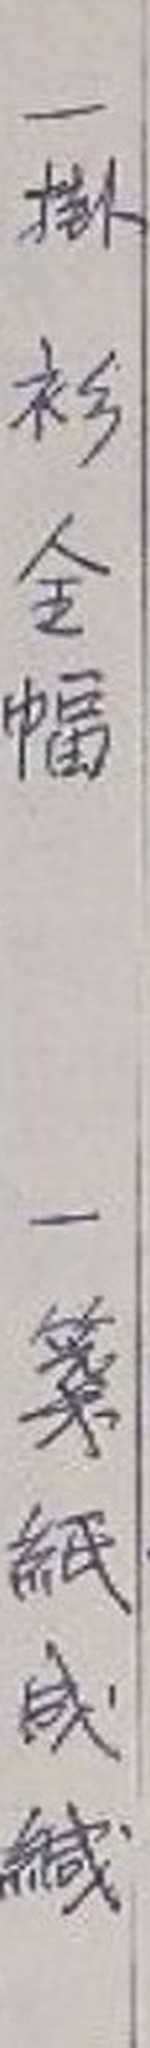一掛衫全幅一箋紙成緘
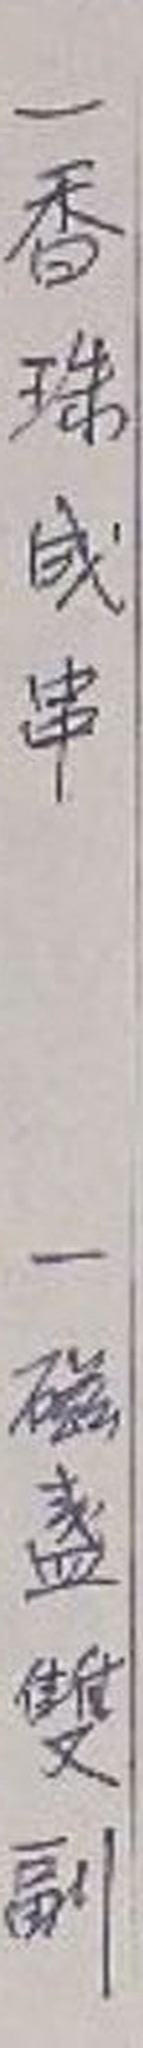一香珠成串一磁盞雙幅
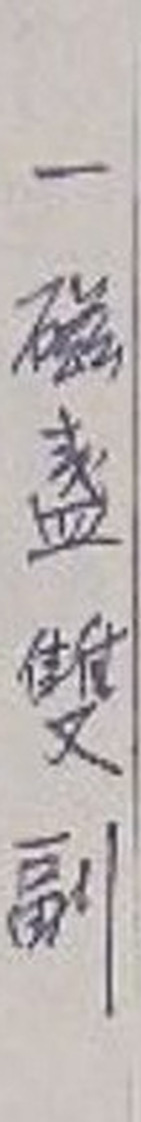一磁杯雙対
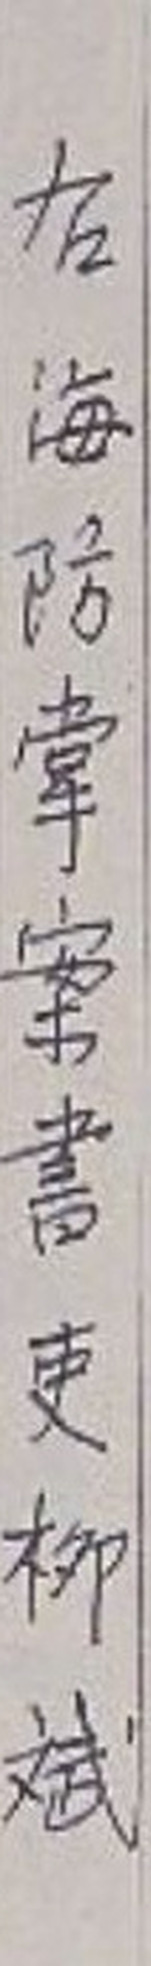右海防掌案書吏柳斌

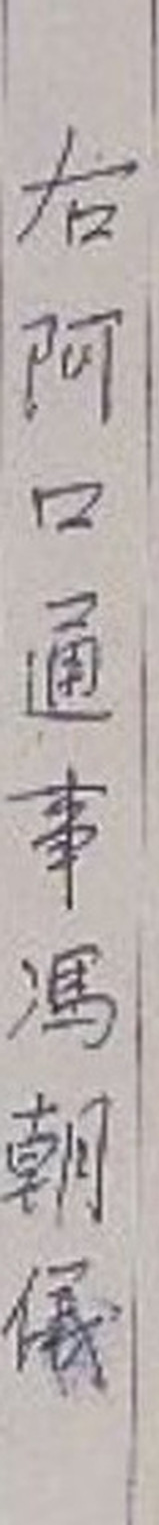右阿口通事馮朝儀
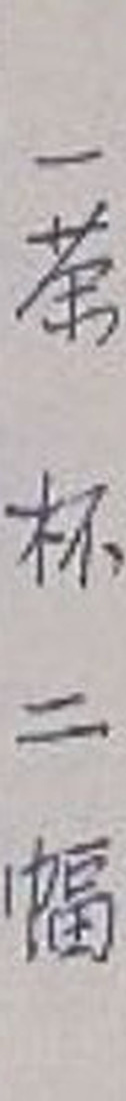一茶杯二幅一套碟二副
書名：支那冊封使来琉諸記 下巻
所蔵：University of the Ryukyus Library
